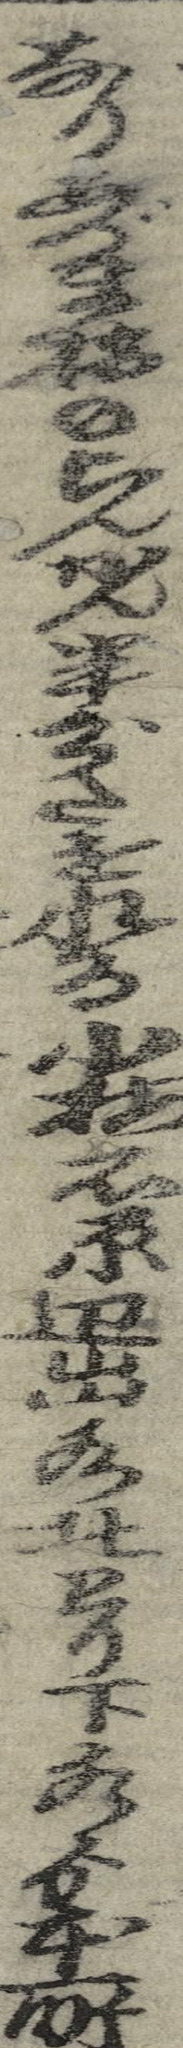なりあづま橋のらんかん半分たをれる小梅石原辺出水北わり下水より本所
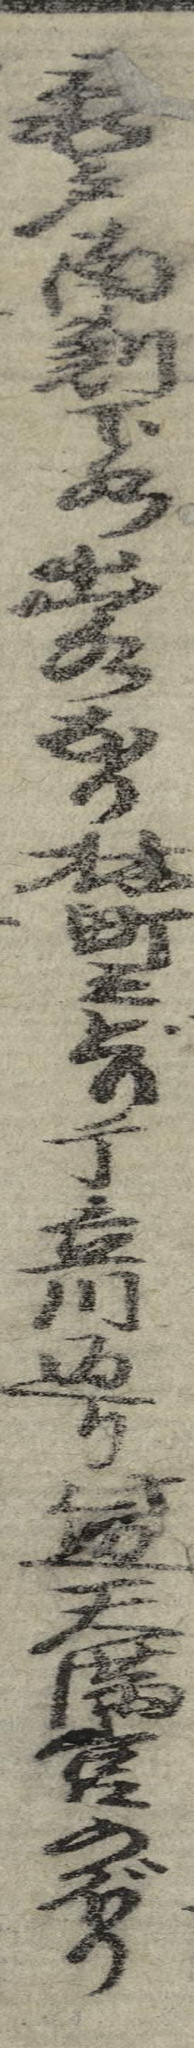亀戸南割下水出水なり林町みどり丁立川通り此辺天満宮のぼり
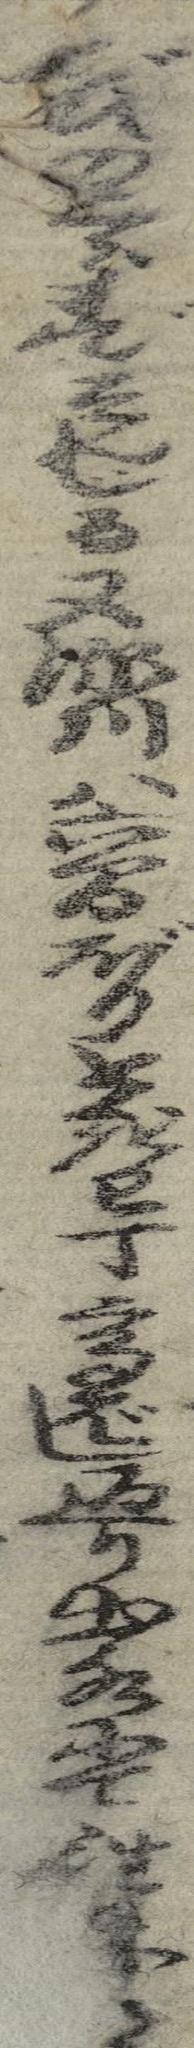ぐひのこらずそんじる又深川は六間ぼりときわ丁高ばし通り出水にての
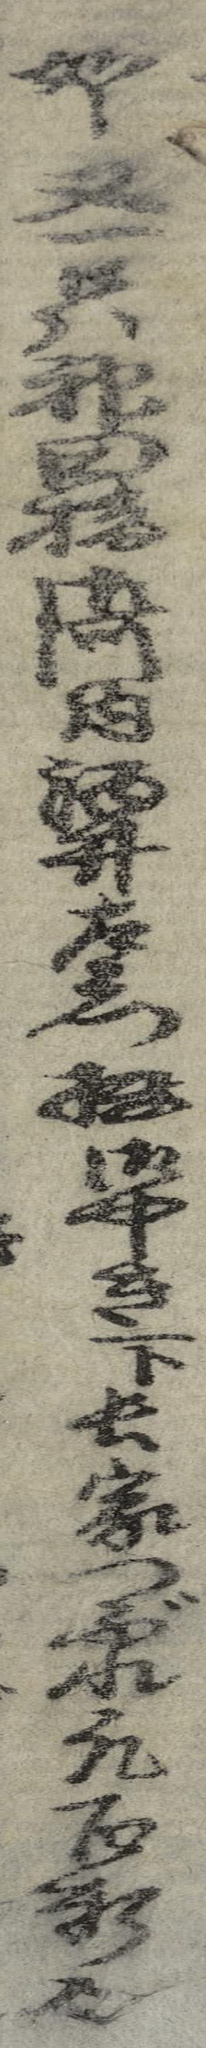如し又一口は神田橋御門内酒井左衛門様御やしき下長家つぶれ凡百軒
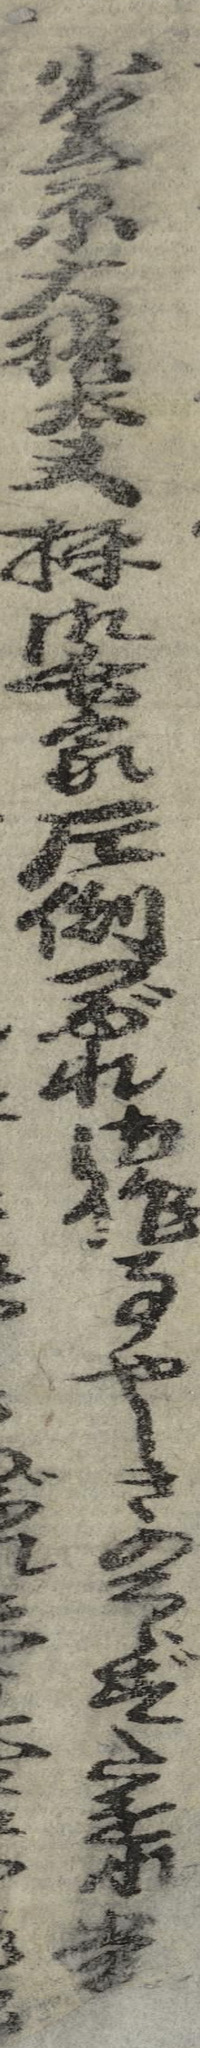小笠原大膳太夫様御長家片側つぶれ御作事やしきのこらずたをれ
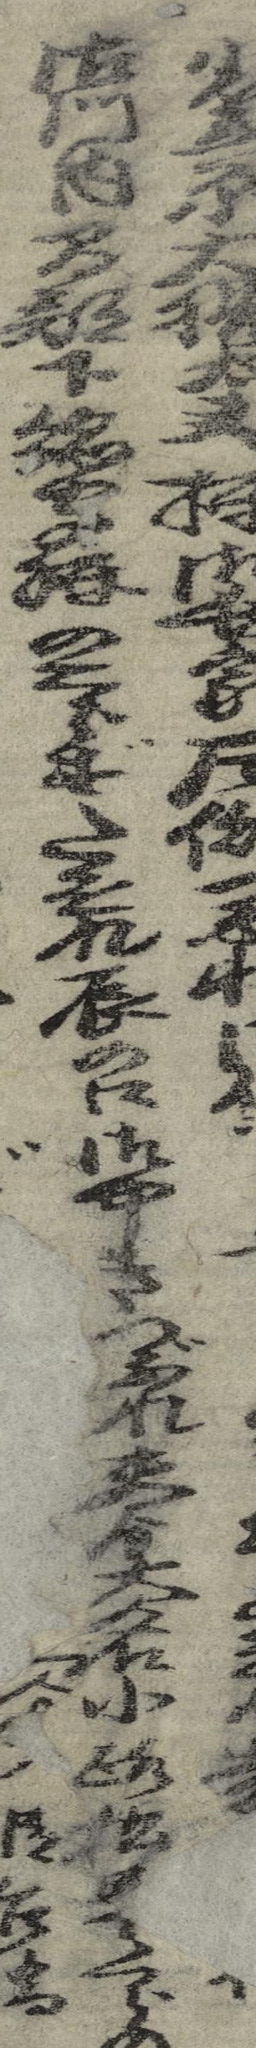御門内間部下総守様のこらずたをれ辰の口御やしきつぶれ夫ゟ大名小路松平くらの
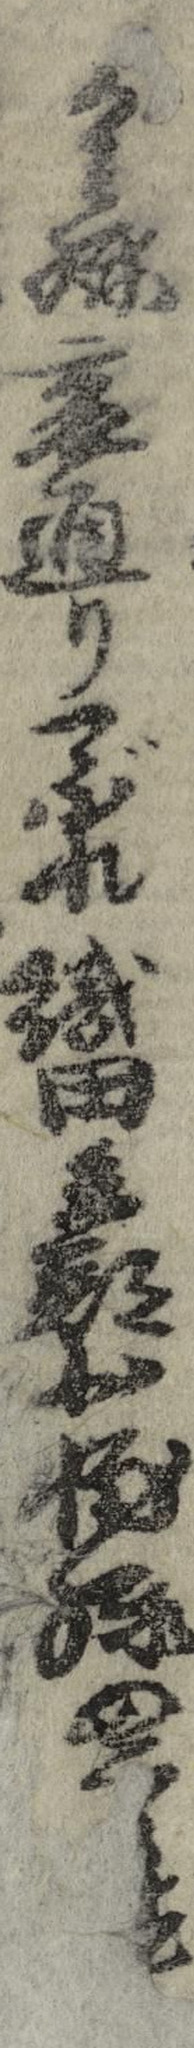かみ様裏通りつぶれ織田兵部少輔様鍛冶橋
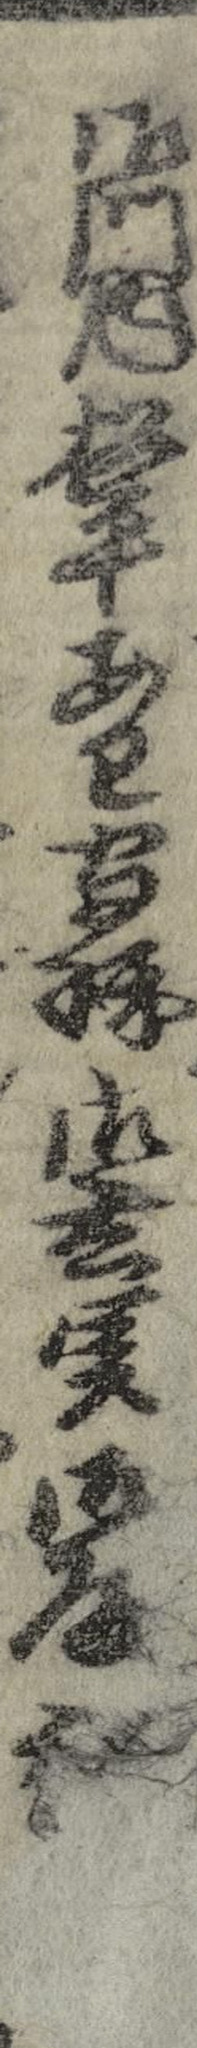御門内松平あわ守様御玄関御
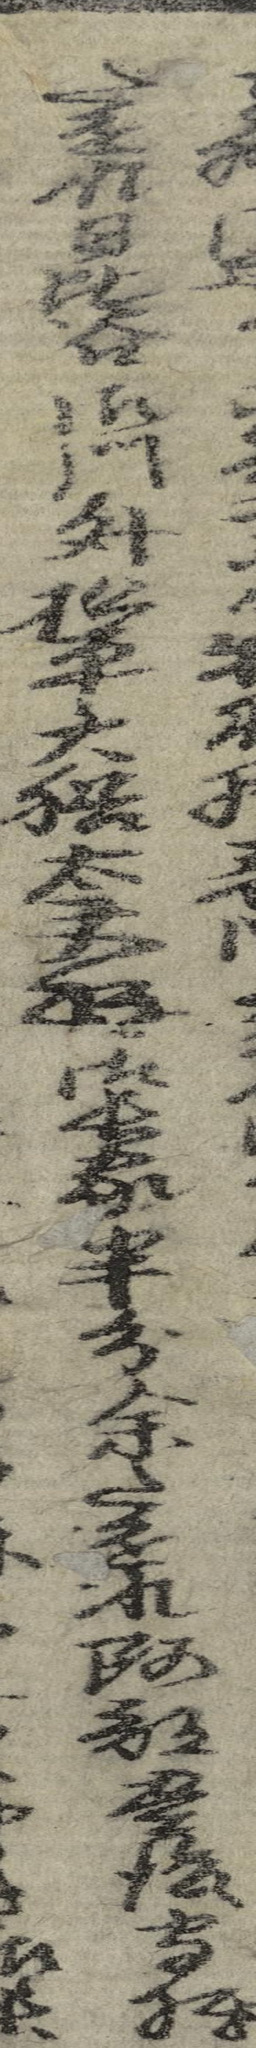たをれ日比谷御門外松平大膳太夫様御長家半分余たをれ服部豊後守様
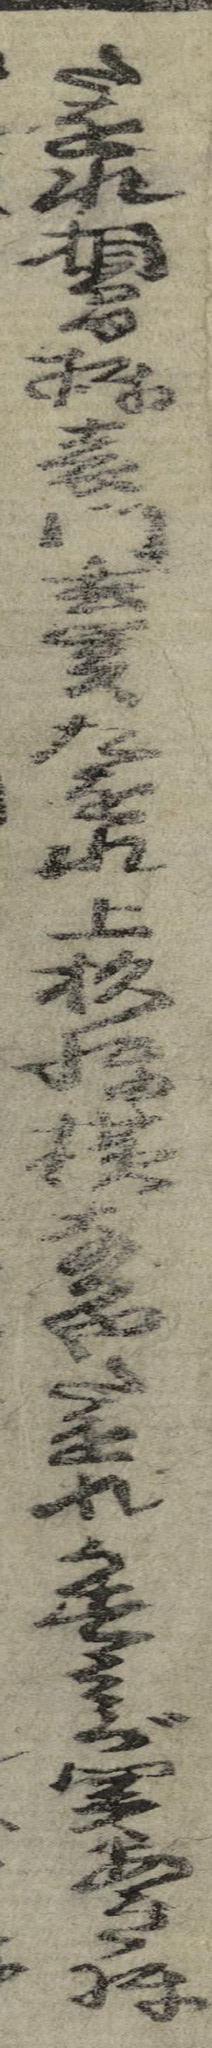たをれ相馬様表門玄関たをれ上杉様横ながやたをれかすみが関あき様
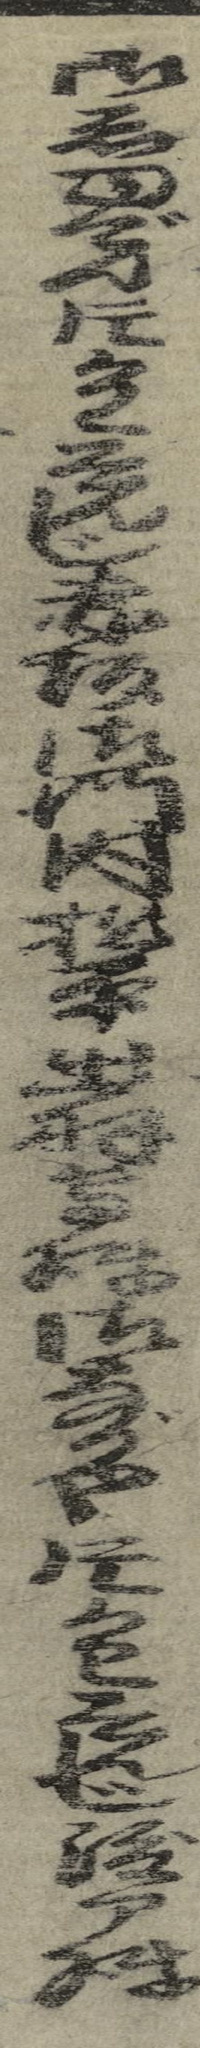御しゆでん片かわそんじ赤坂御門内松平出羽守様御ながや片かわそんじ渡部様
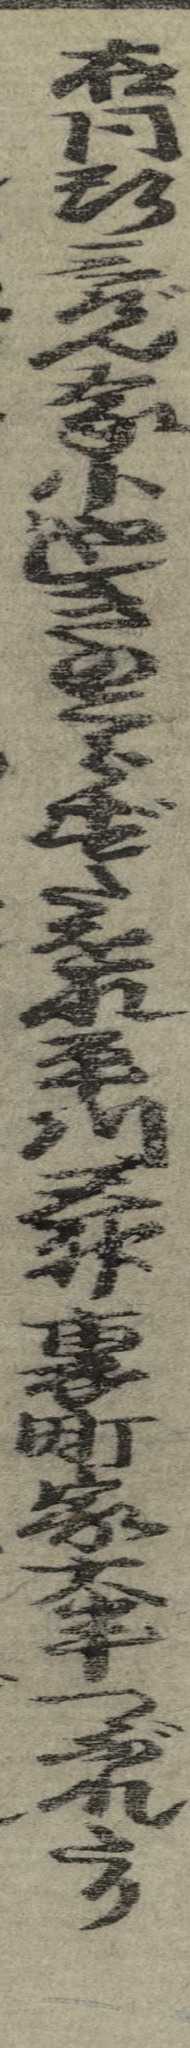右同断三げん家小やしきのこらずたをれ平川天神裏町家大半つぶれたり
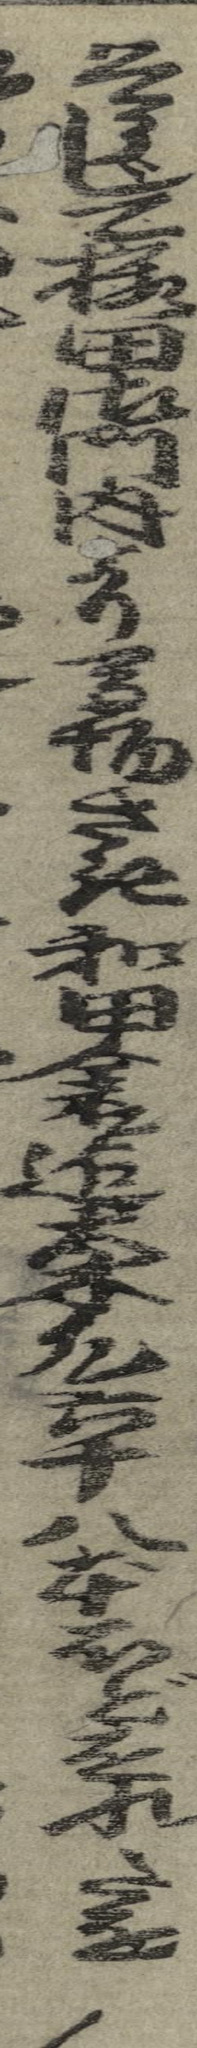そうじて桜田御門内より馬場さき和田倉迠大木凡六十八本ほどをれたを
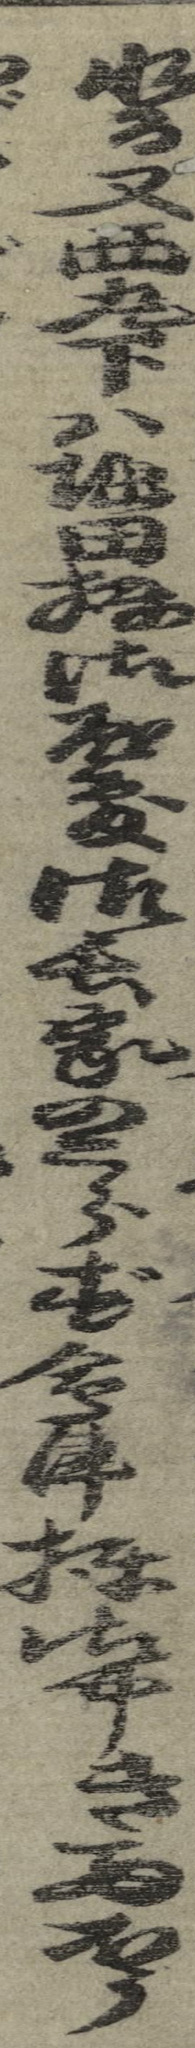れる又西丸下は堀田様御屋敷御長家のこらず会津様御やしき両ほう
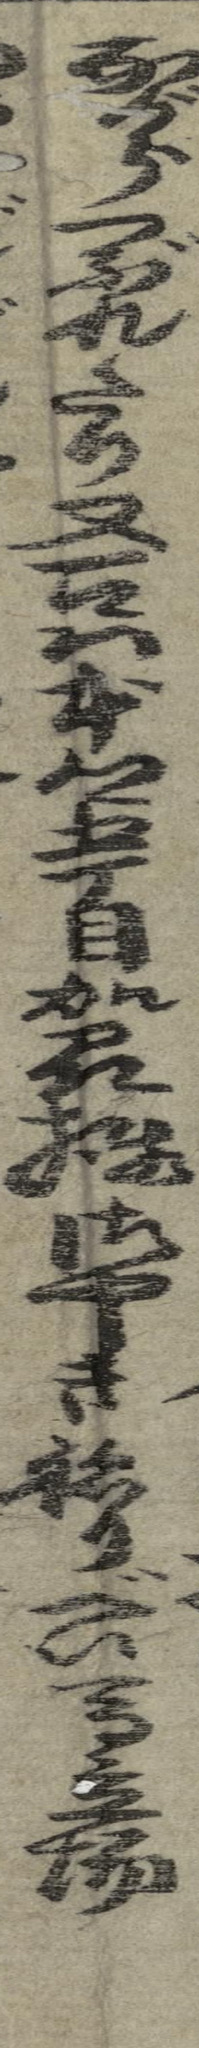ながらつぶれたり又一口は本郷五丁目加州様御やしきねりべい馬立場
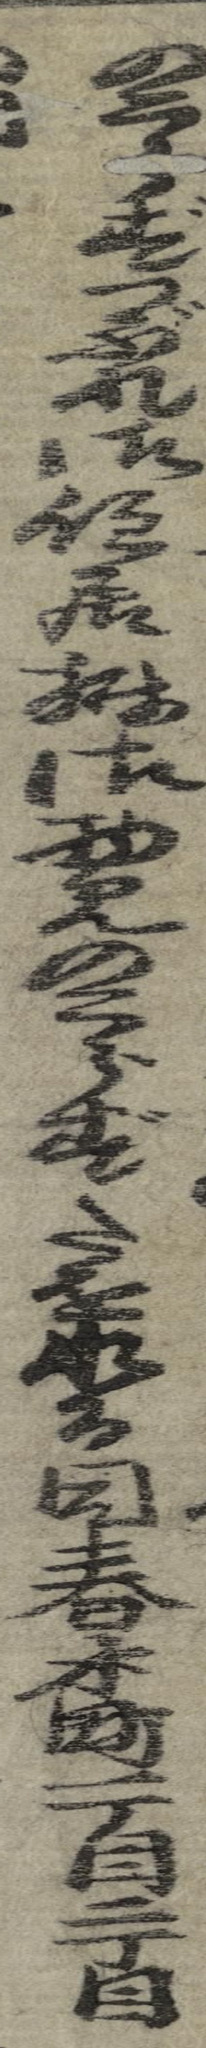のこらずつぶれ御住居棟御物見のこらずたをれる同春木町一丁目二丁目
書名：江戸近在　大風出水焼場附
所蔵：東京大学地震研究所図書室 Earthquake Research Institute Library, The University of Tokyo, JAPAN
